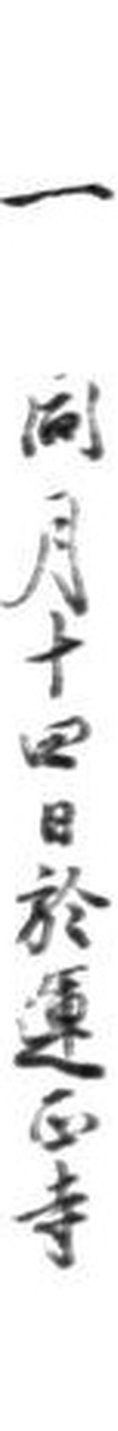一同月十四日於運正寺
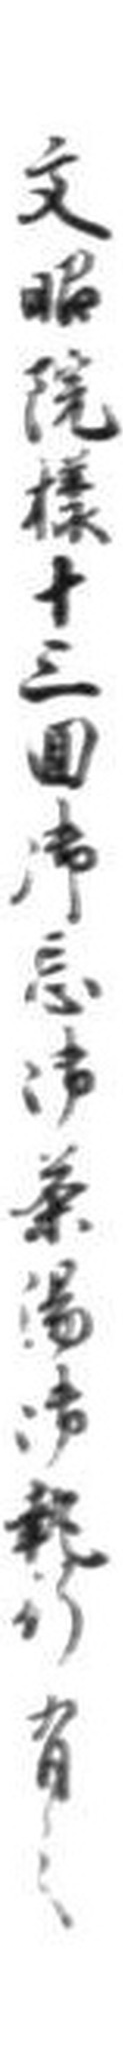文昭院様十三回御忌御茶湯御執行有之
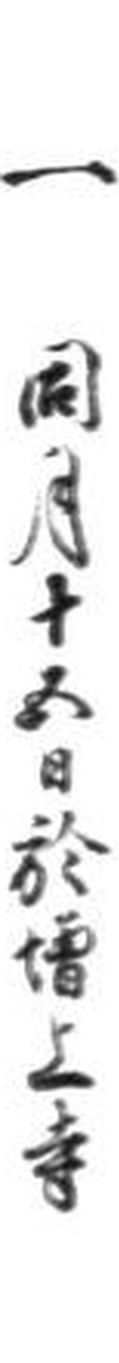一同月十五日於増上寺

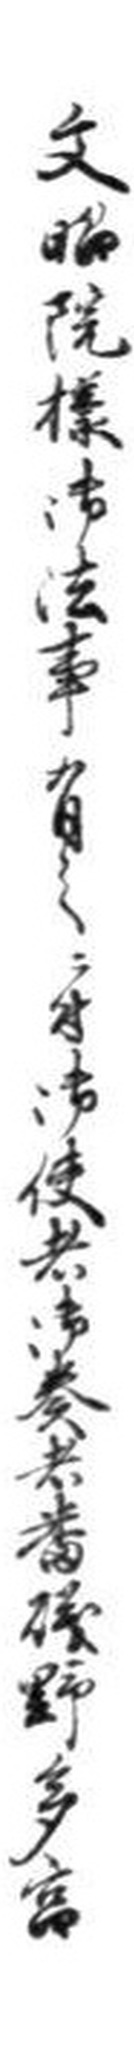文昭院様御法事有之ニ付御使者御奏者番磯野多宮
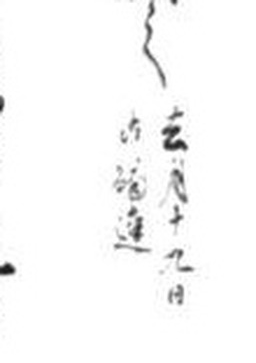御触達
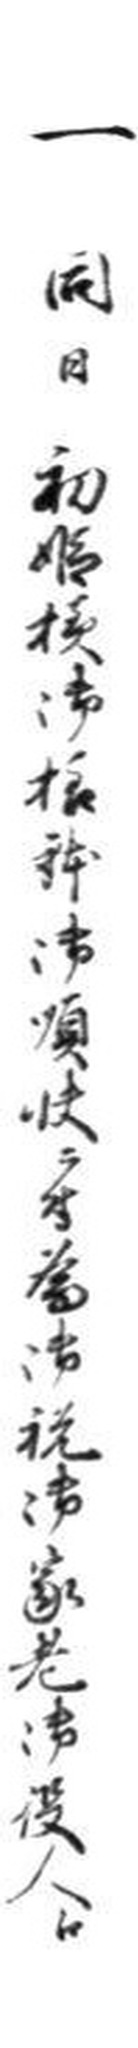一同日初姫様御様体御順快ニ付為御祝御家老御役人江
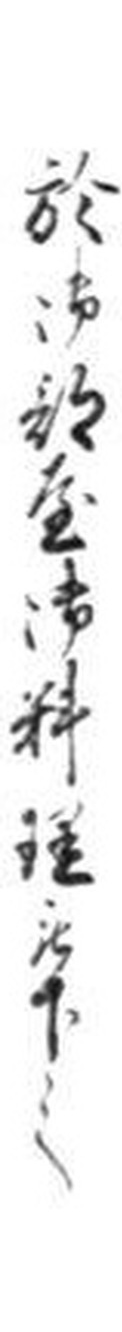於御部屋御料理被下之
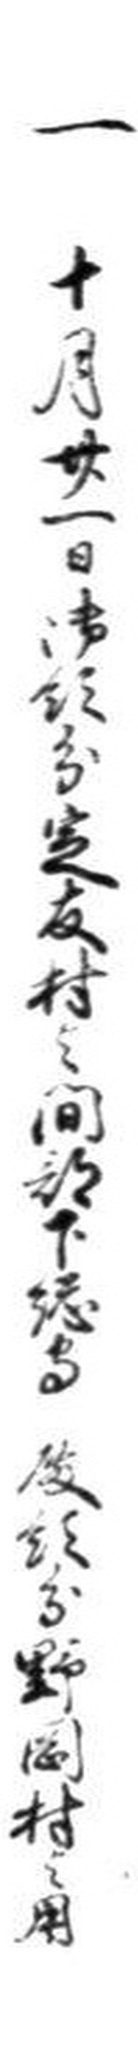一十月廿一日御領分定友村与間部下総守殿領分野岡村与用
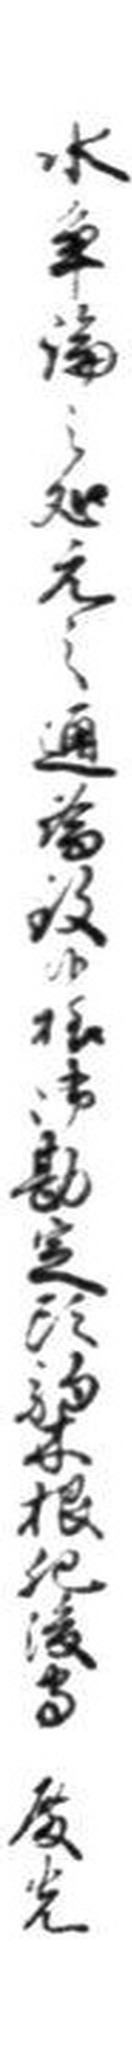水争論之処元之通為致候様御勘定頭駒木根肥後守殿先
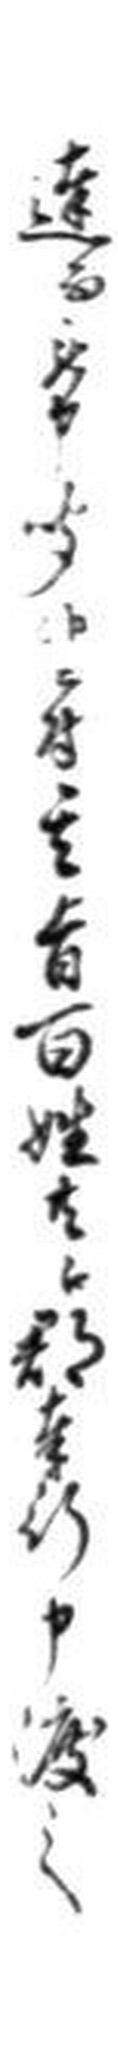達而被申聞候ニ付其旨百姓共江郡奉行申渡之
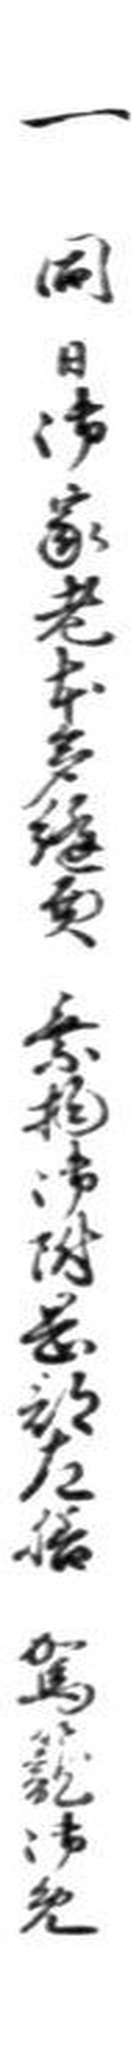一同日御御家老本多縫殿乗物御附岡部左膳駕籠御免
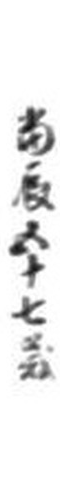当辰五十七歳
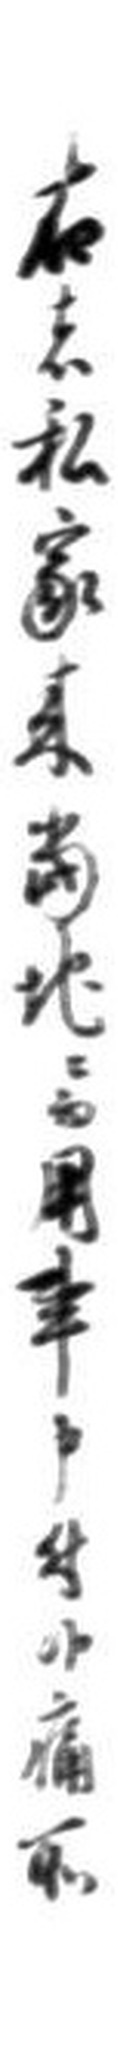右者私家来当地ニ而用事申付候痛所
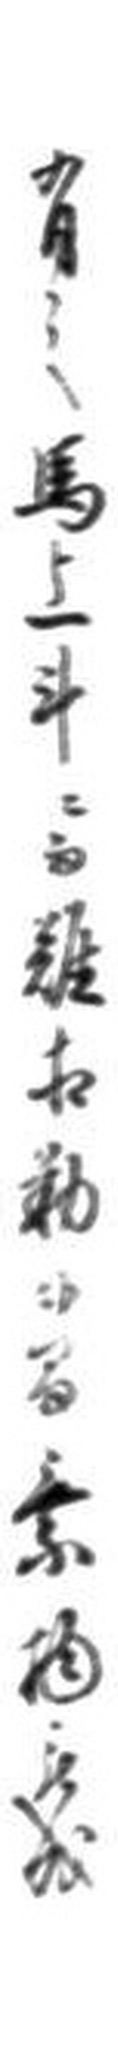有之馬上斗ニ而難相勤候間乗物被成
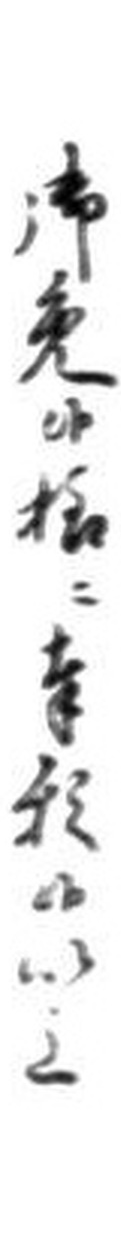御免候様ニ奉願候以上
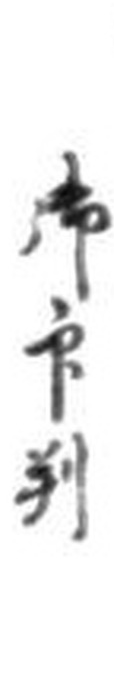御印判
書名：家譜 三十八 宗矩公 従享保九年五月到享保九年十二月
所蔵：福井県文書館 Fukui Prefectural Archives
